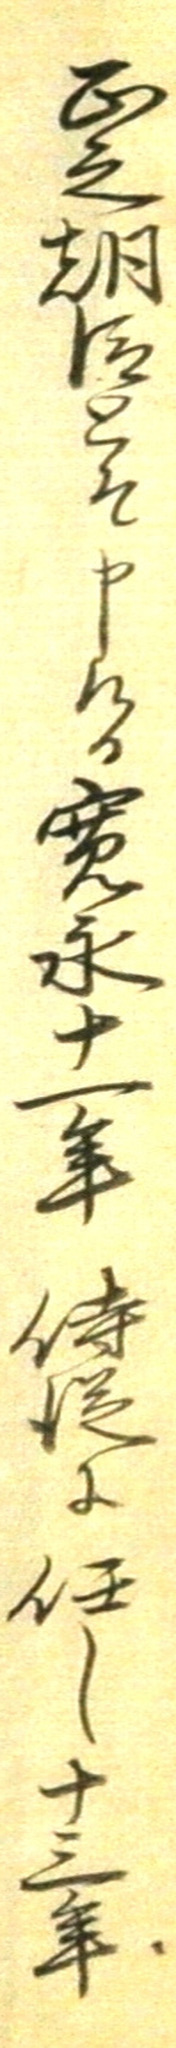正之朝臣とそ申ける寛永十一年侍従に任し十三年

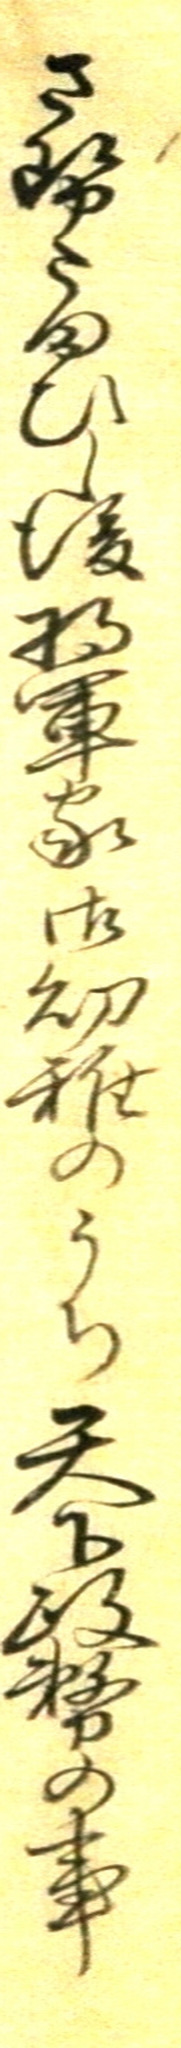させたまひし後将軍家御幼稚のうち天下政務の事
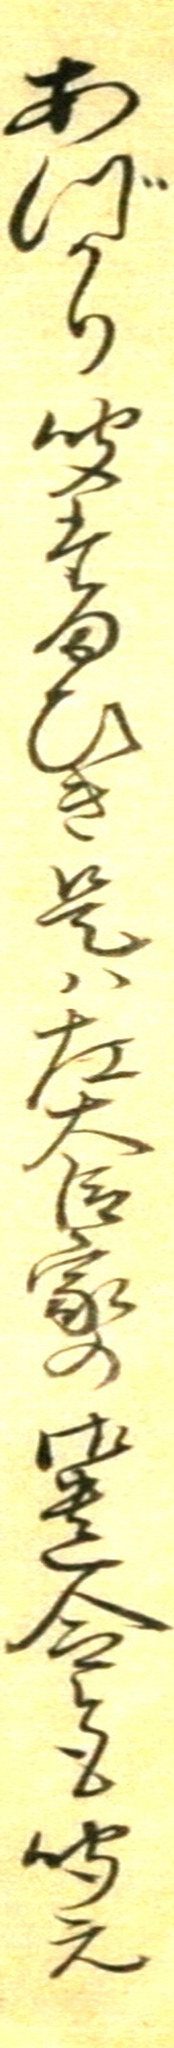あづかり聞たまひき是は左大臣家の御遺令とも聞え
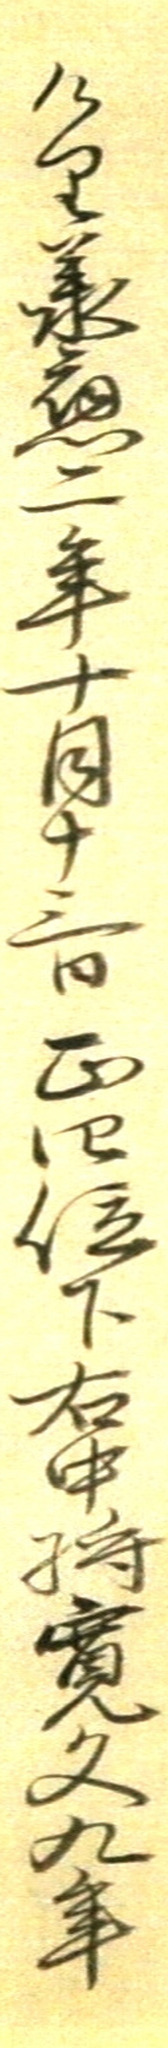けり承応二年十月十三日正四位下右中将寛文九年
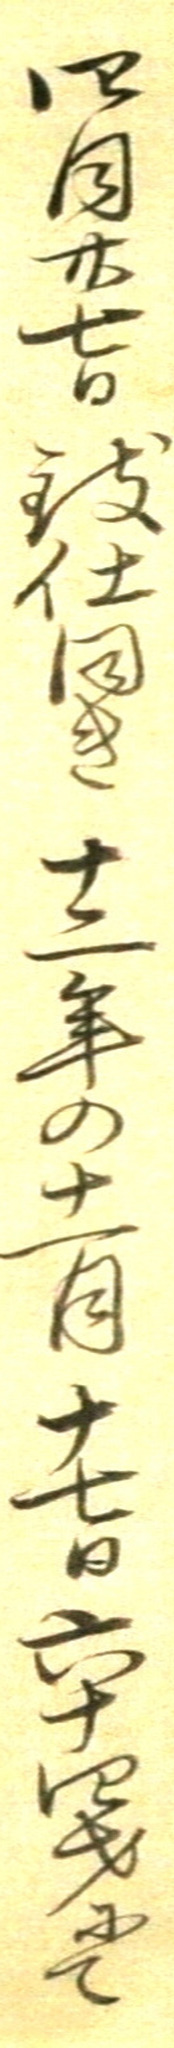四月廿七日致仕同き十二年の十一月十七日六十四才にて
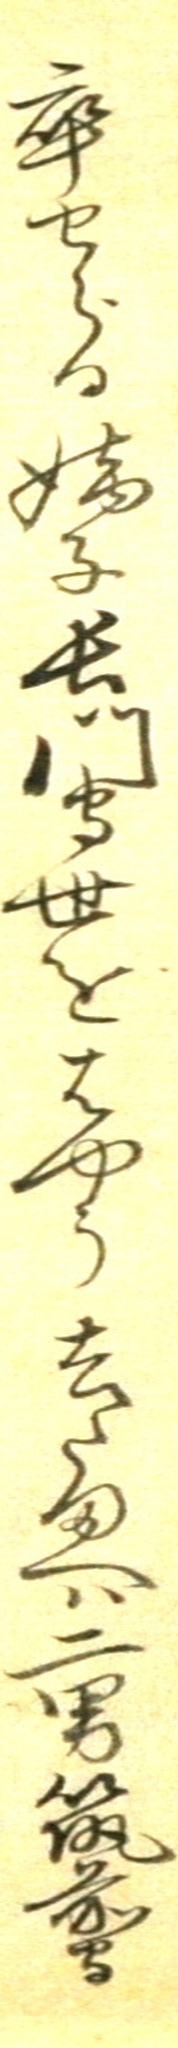卒せらる嫡子長門守世をはやう去たまへは二男筑前守
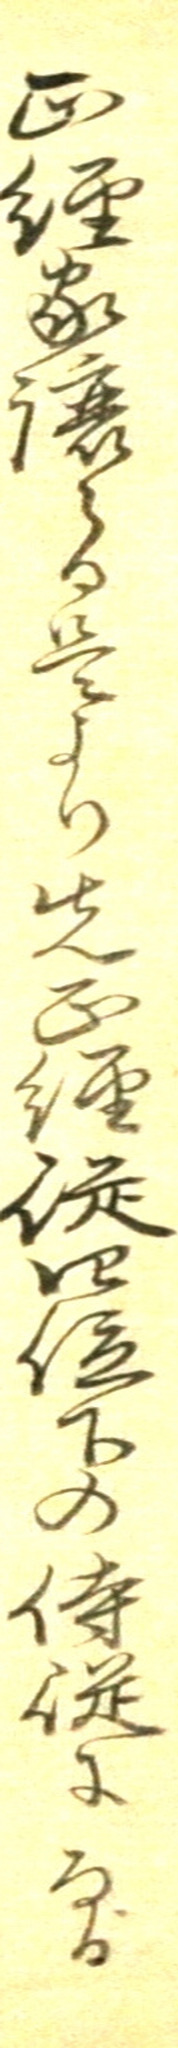正経家譲らる是より先正経従四位下の侍従になる
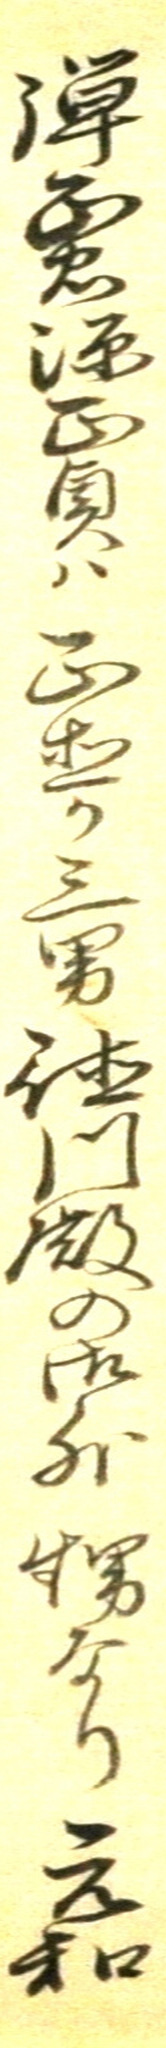弾正忠源正貞は正直か三男徳川殿の御外甥なり元和
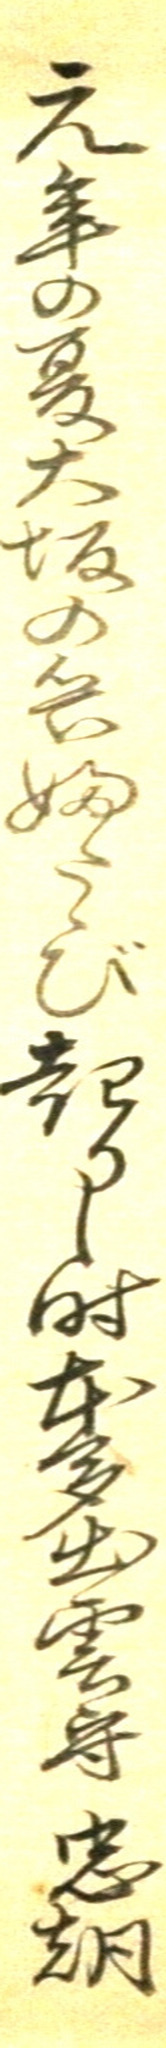元年の夏大坂の兵ふたゝび起りし時本多出雲守忠朝
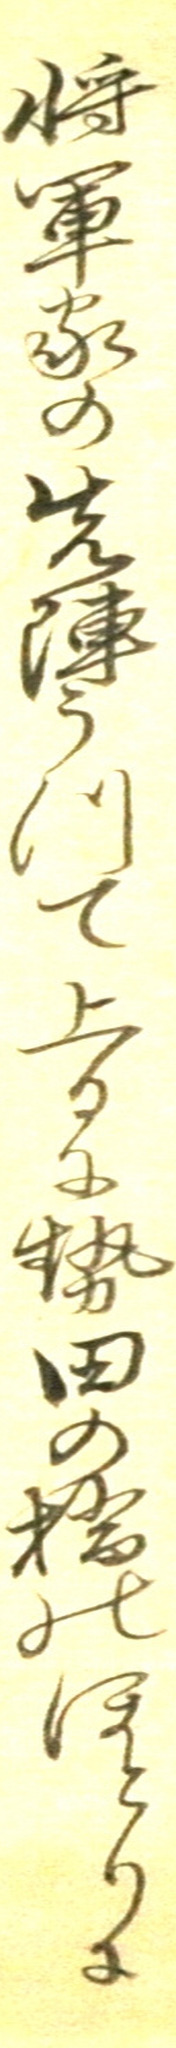将軍家の先陣うつて上るに勢田の橋のほとりに
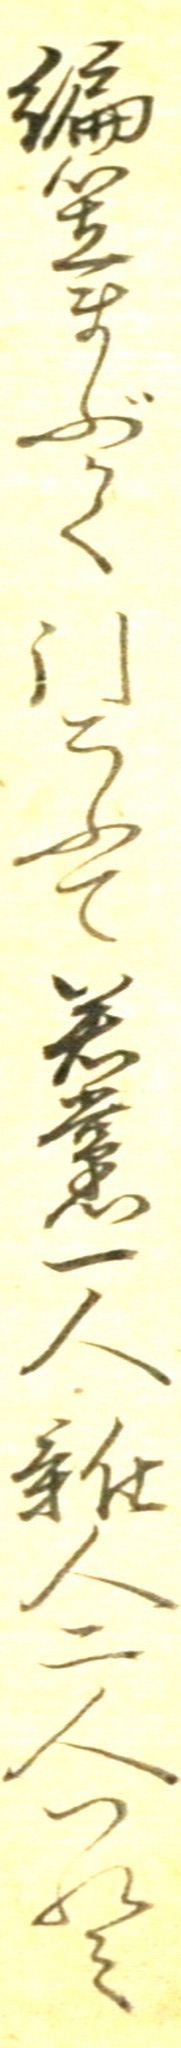編笠まぶかく引こふて若党一人雑人二人つれて
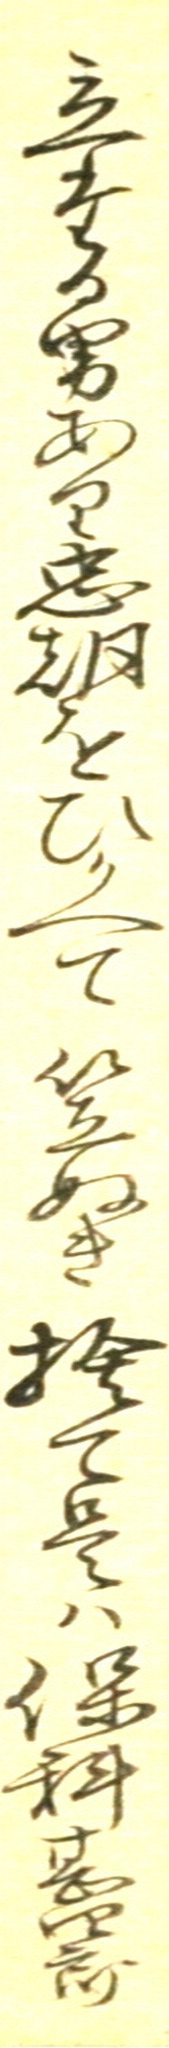立たる男あり忠朝をひかへて笠ぬき捨て是は保科甚四郎
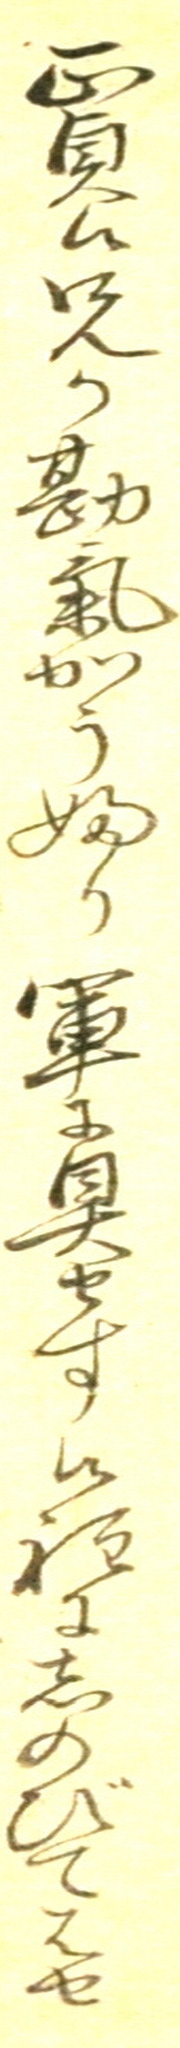正貞候兄か勘気かうふり軍に具せす候程にしのびてはせ
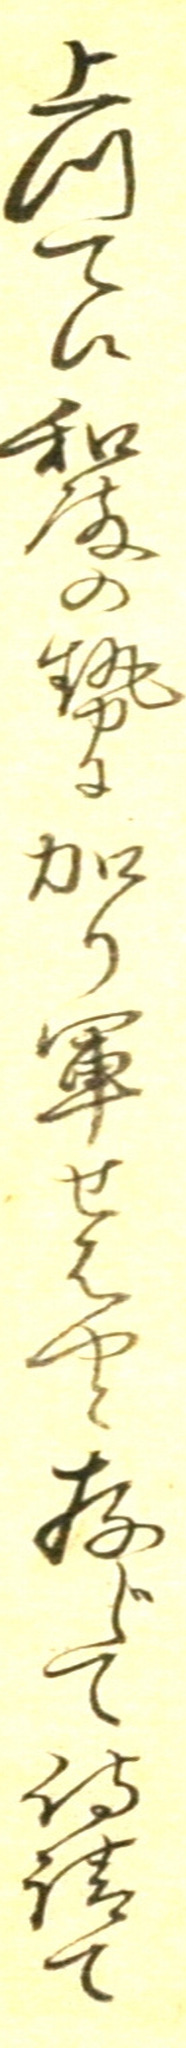上つて候和殿の勢に加り軍せはやと存じて待請て
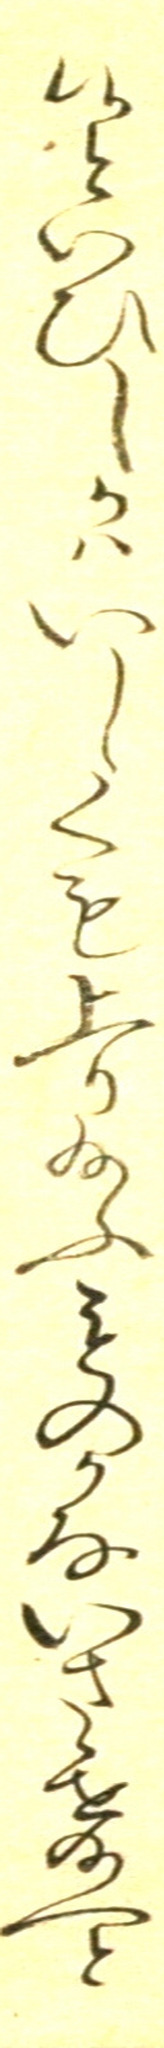候といひしかはいしくも上り給ふものかないさゝせ給へと
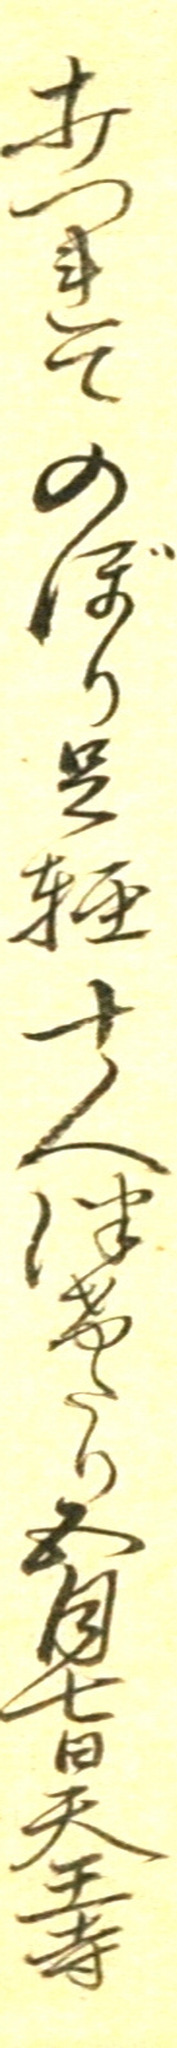打ちつれてのぼり足軽十人つけたり五月七日天王寺
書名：藩翰譜（一）
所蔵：伊那市立高遠町図書館・合同会社AMANE
